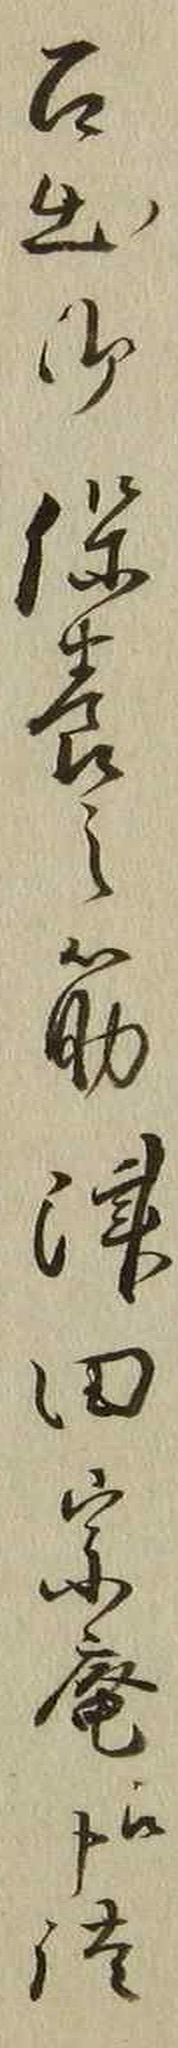召出御保養之筋津田宗庵江申談
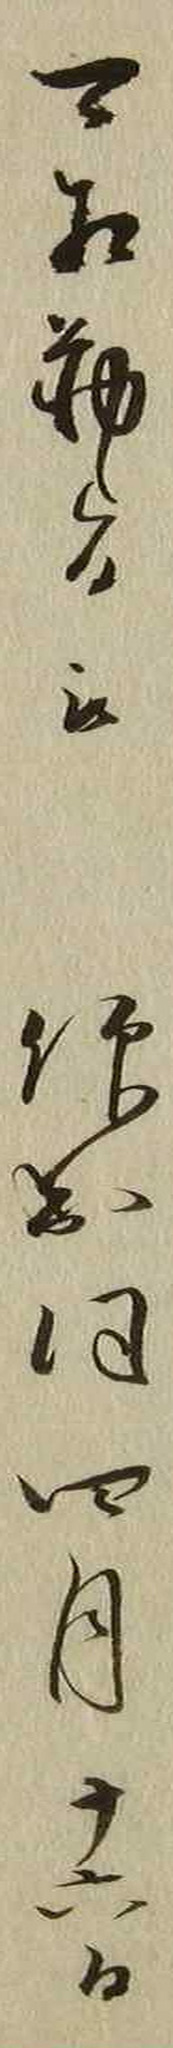可相勤旨被仰出同四月十六日
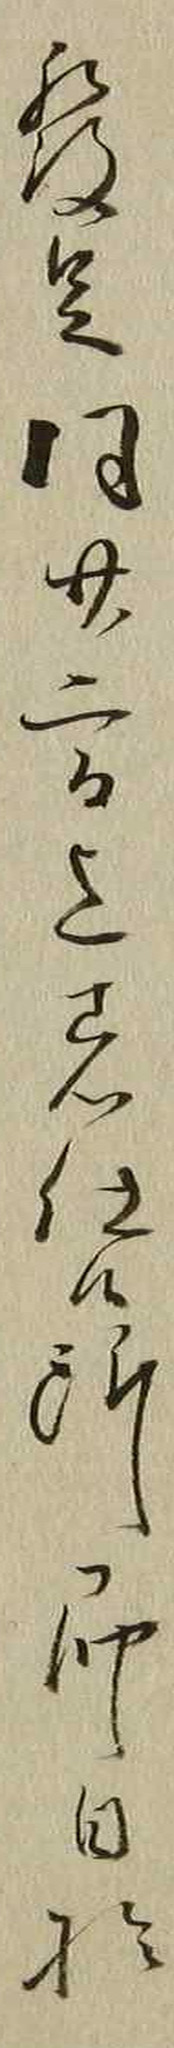発足同廿二日迄着仕候所即日於
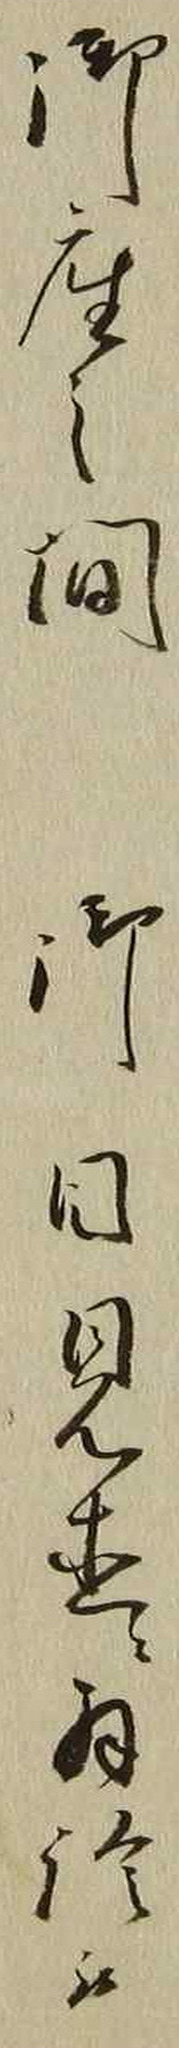御座之間御目見直ニ拝診被
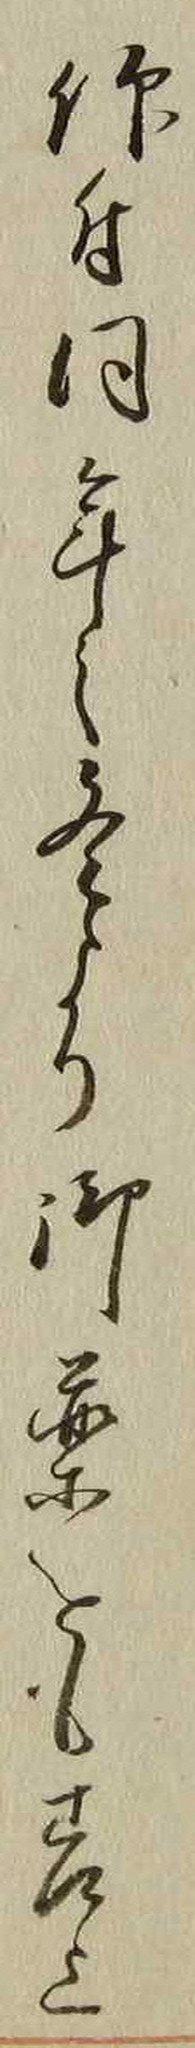仰付同年之冬より御薬をも差上
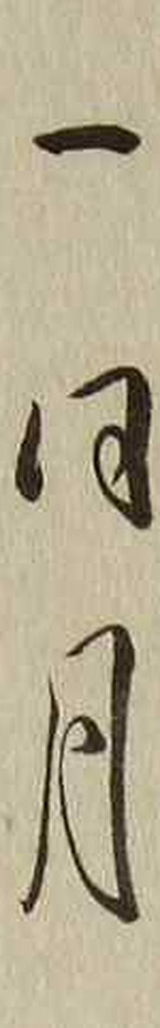一同月
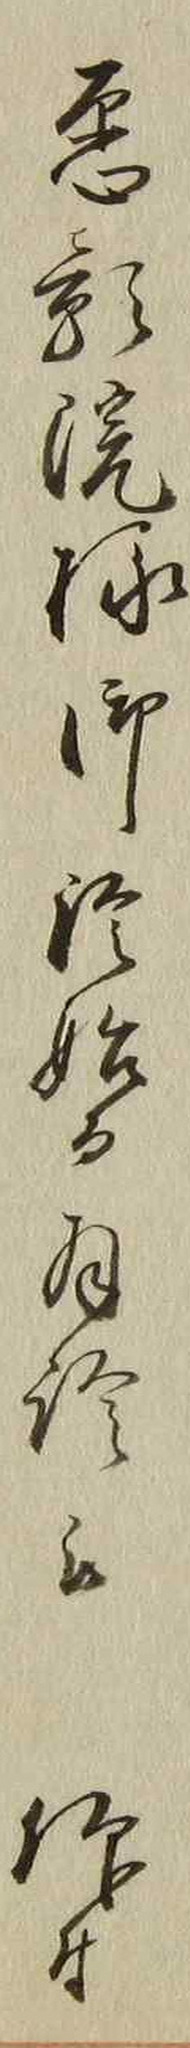愿彰院様御診始而拝診被仰付
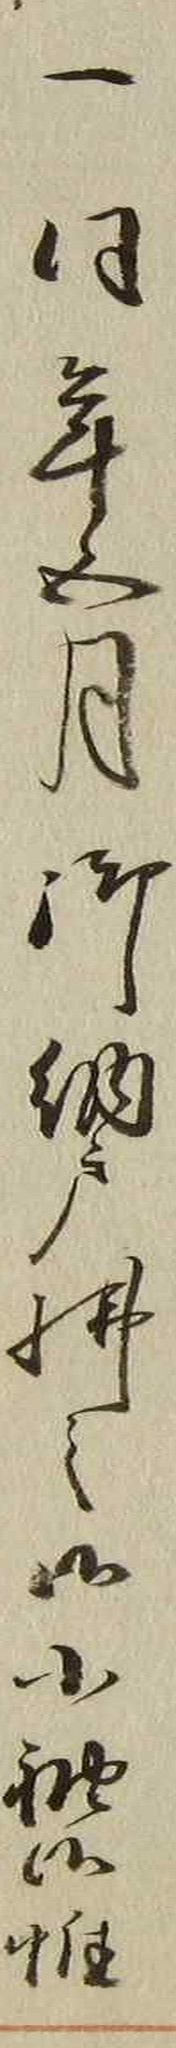一同年五月御納戸払之御小袖御帷
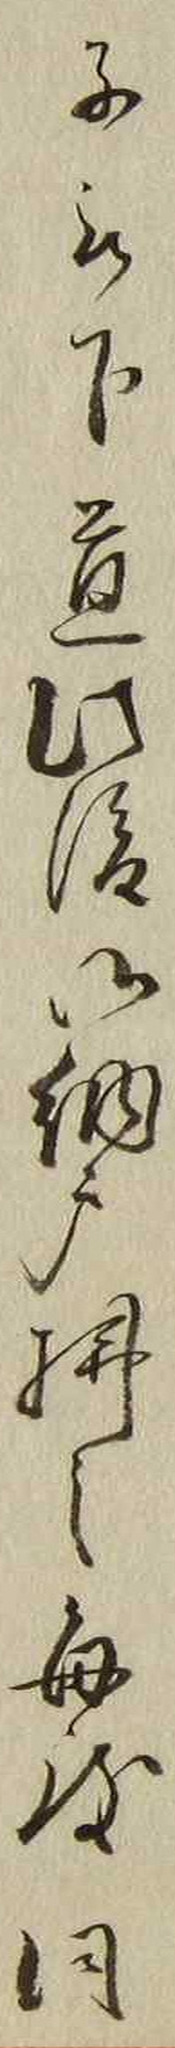子被下置此後御納戸払之毎度同
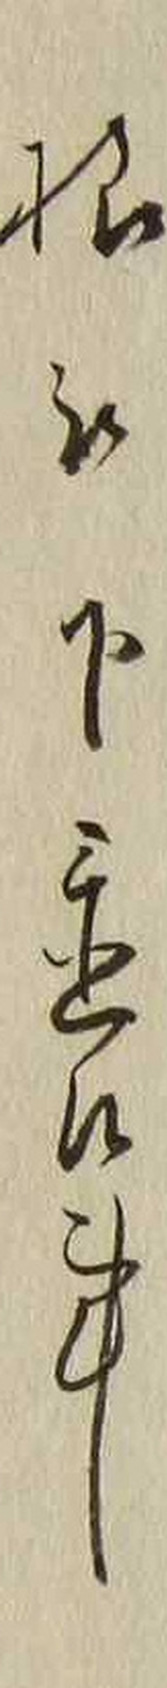様被下置候事
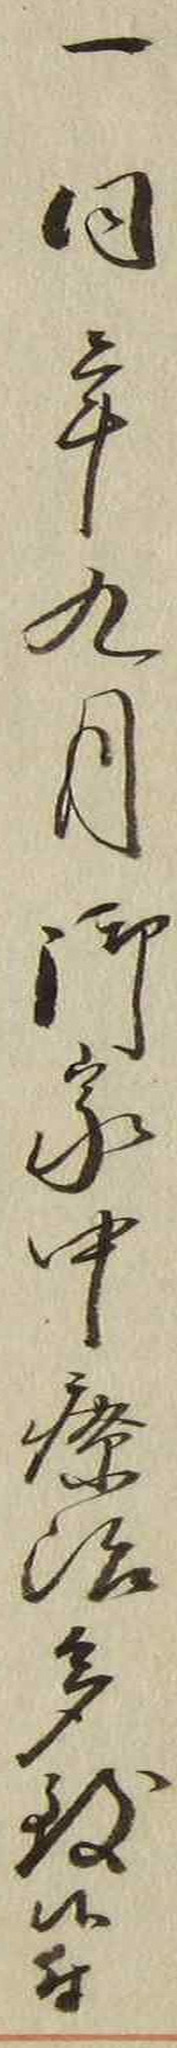一同年九月御家中療治多致候付
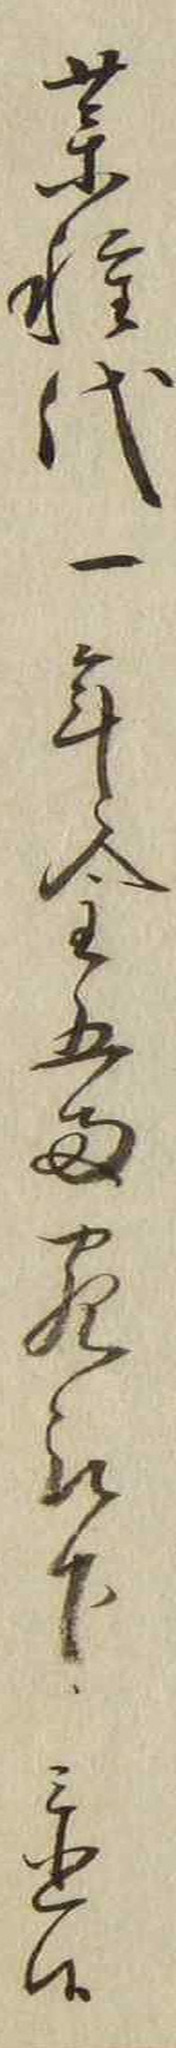薬種代一年金五両宛被下置候

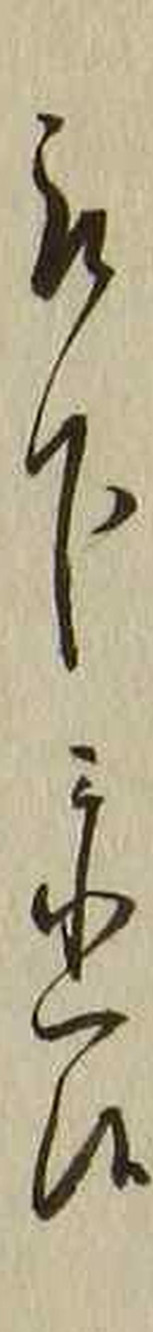被下置候
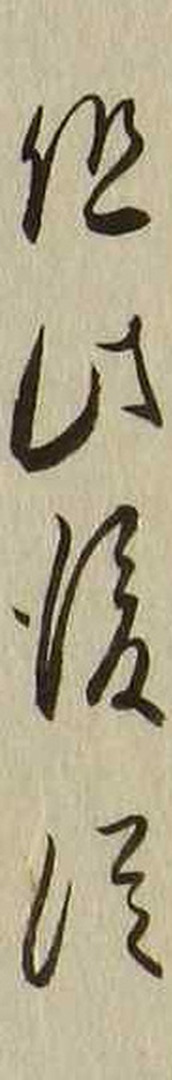但此後従
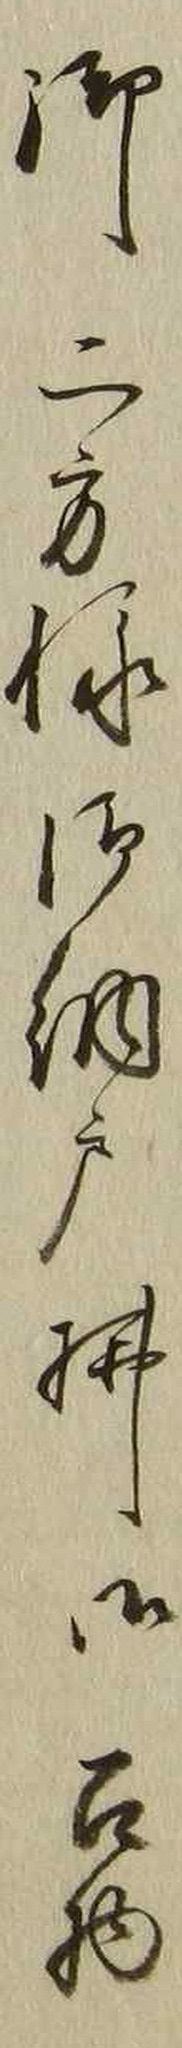御二方様御納戸払御召物
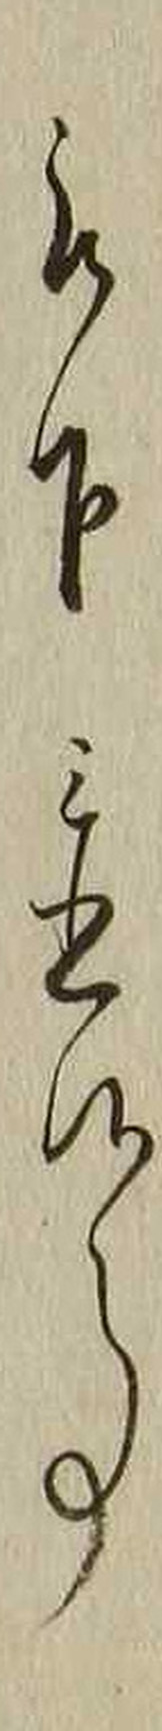被下置候事
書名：諸士系譜　巻之68　を之部2
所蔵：会津若松市立会津図書館
